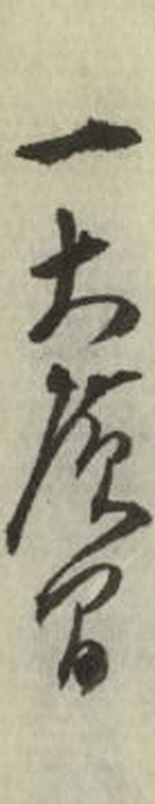一大広間
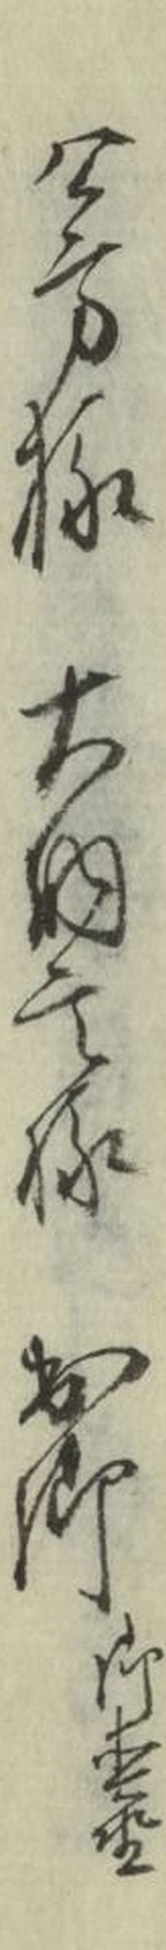公方様大納言様出御御直垂
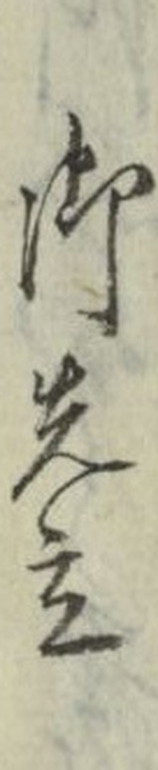御先立
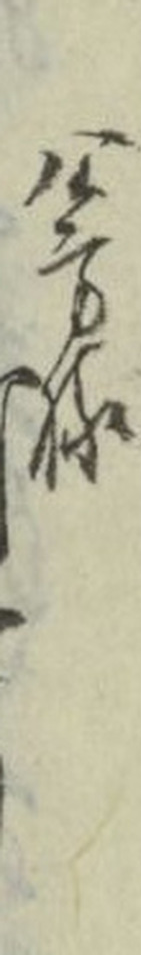公方様
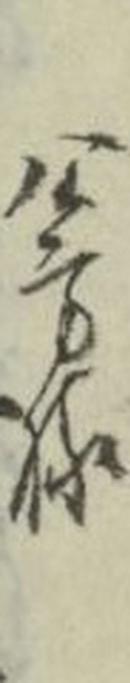公方様
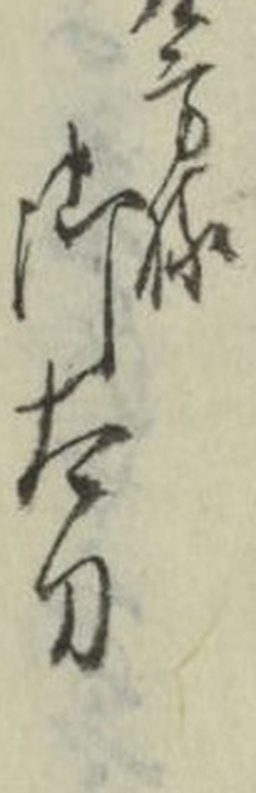御太刀
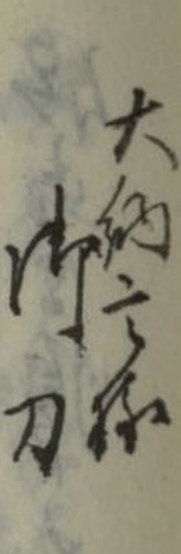大納言様
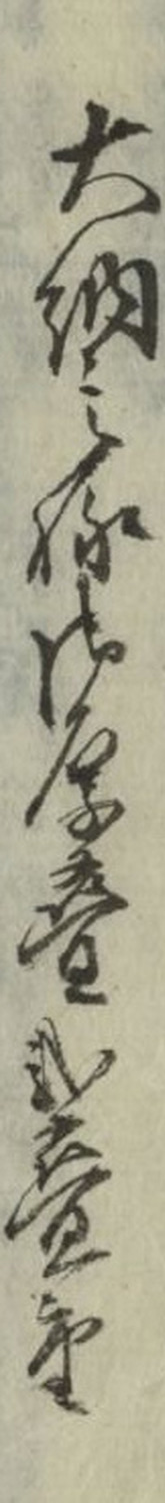大納言様御厚畳弐畳重
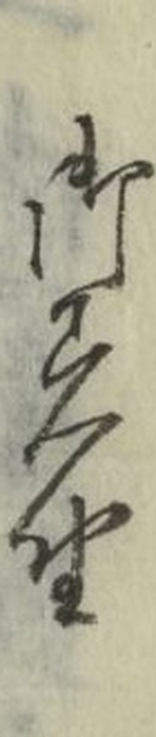御着坐

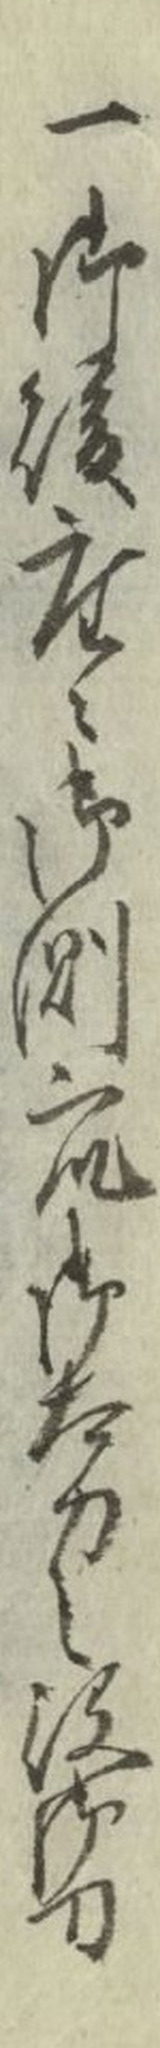一御後坐に御側衆御太刀之役御刀
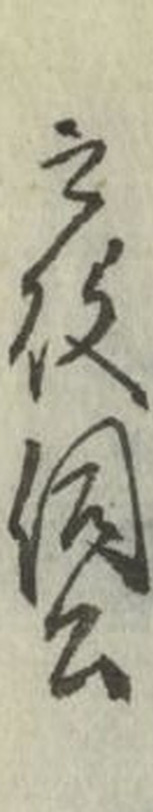之役伺公
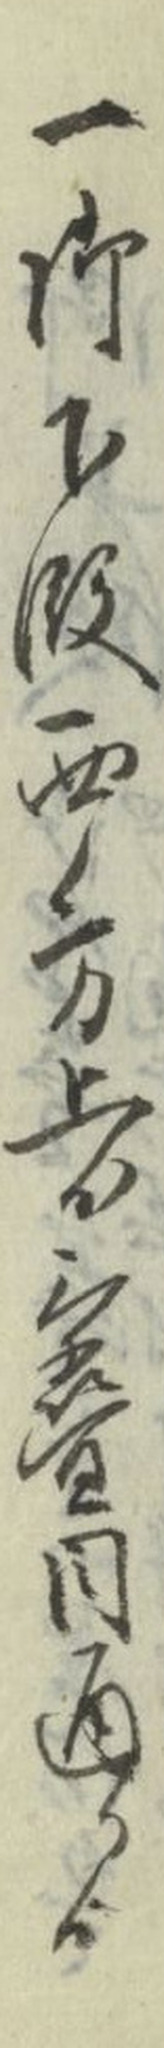一御下段西の方上ゟ三畳目通りゟ
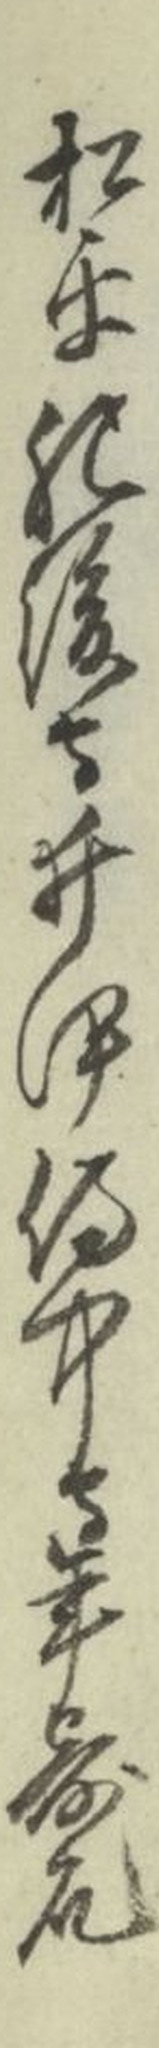松平肥後守井伊備中守年寄衆
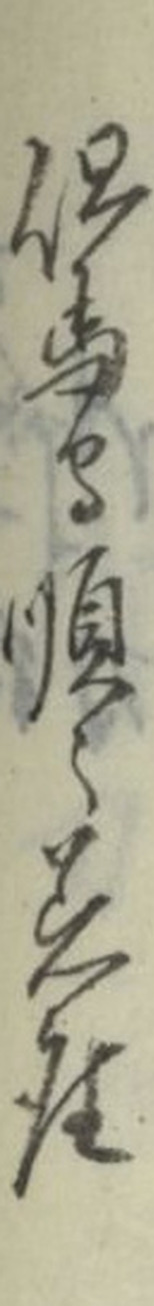但馬守順々着座
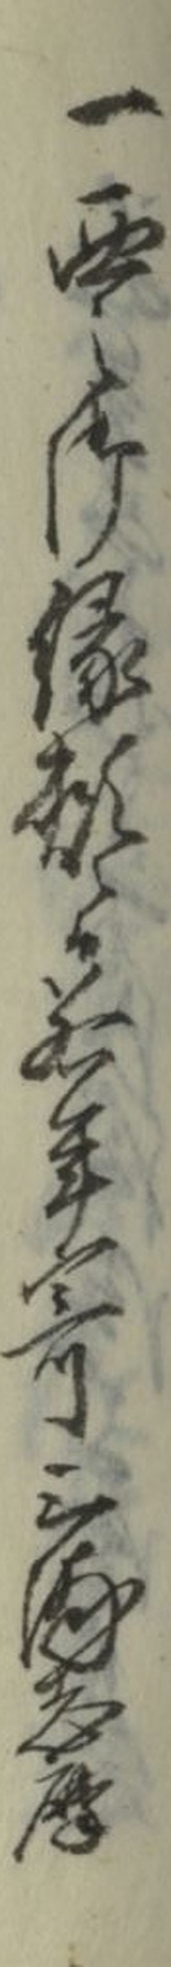一西之御縁頬に而若年寄三浦志摩
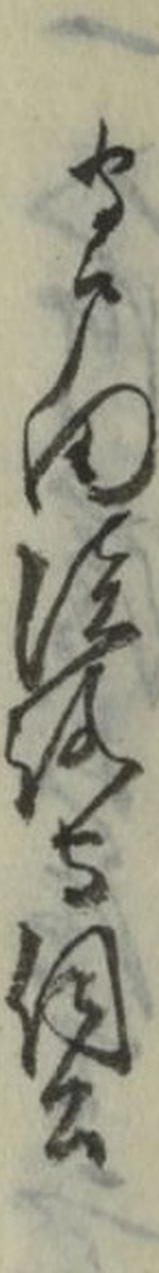守戸田淡路守伺公
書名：琉球人来朝記 四之五
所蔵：University of the Ryukyus Library
